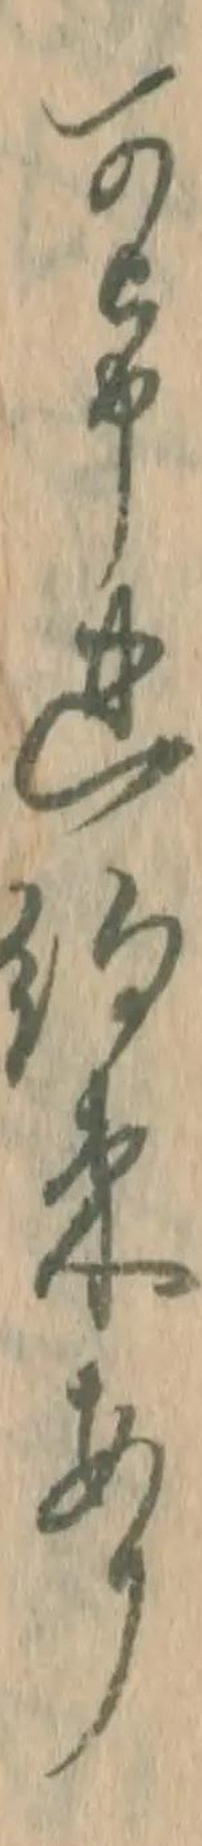可被申迚約束あり

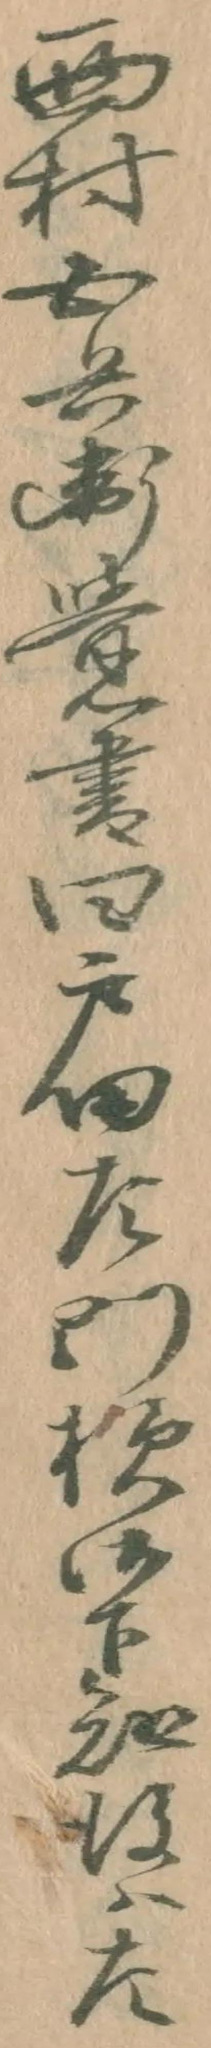西村五兵衛覚書曰戸田左門様御下知得は左
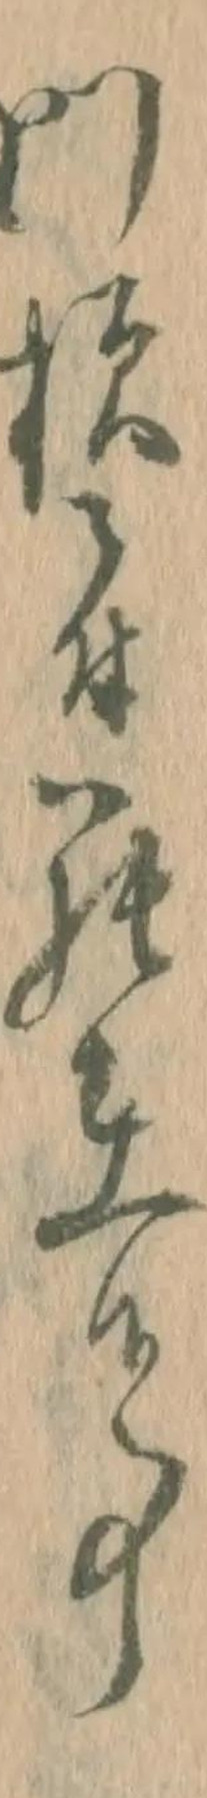門様に付罷在候事
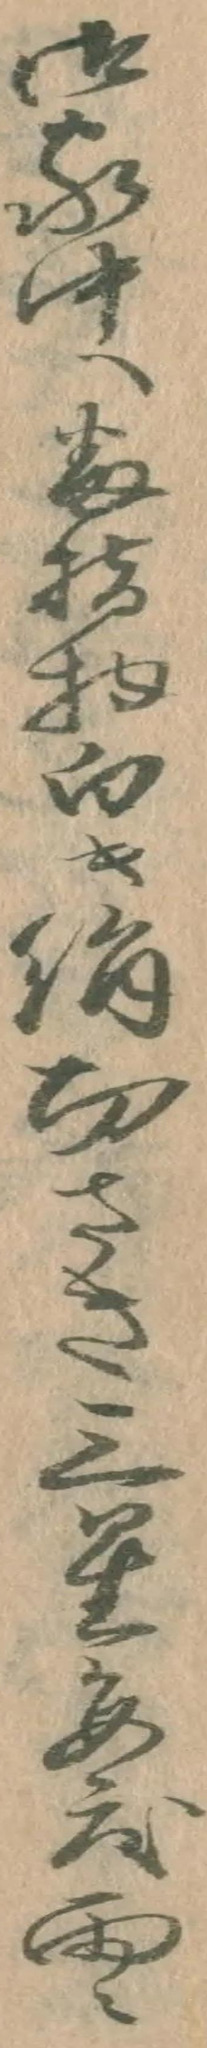御家中へ番指物白き絹切さき三星安茂雨に
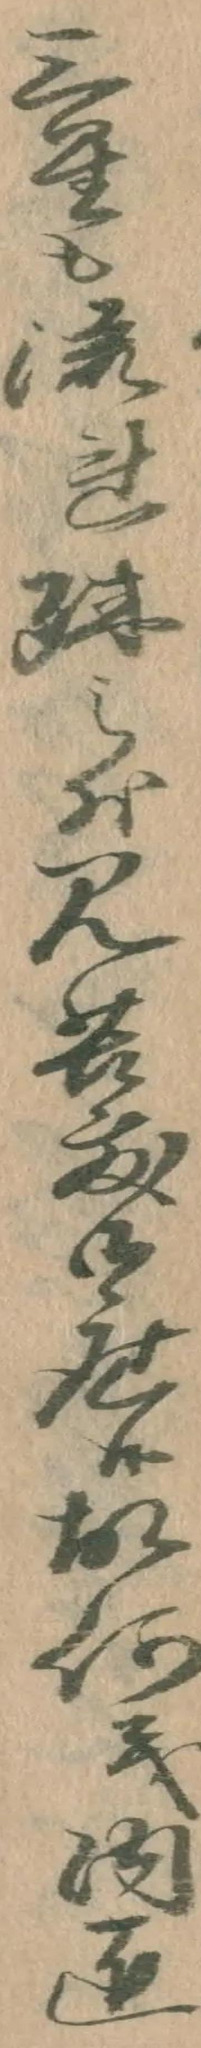三星も流連殊之外見苦敷御座候故何義内匠
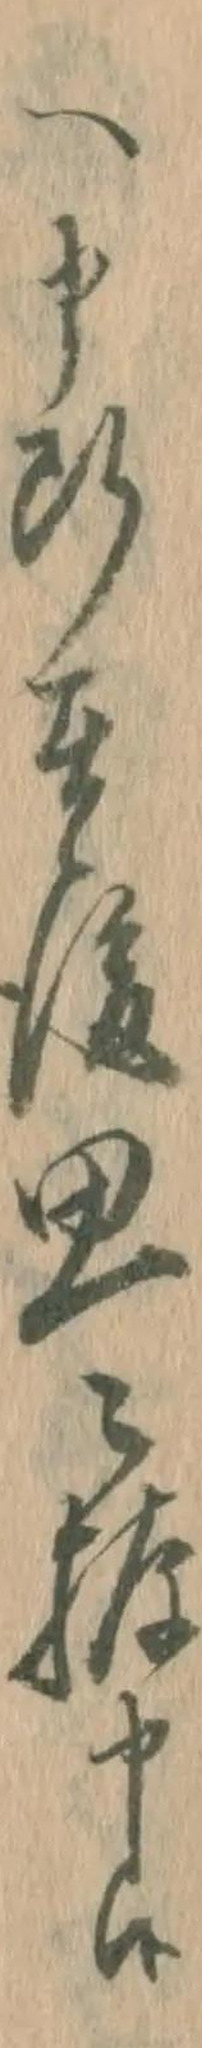へ申断其後思に拵申候
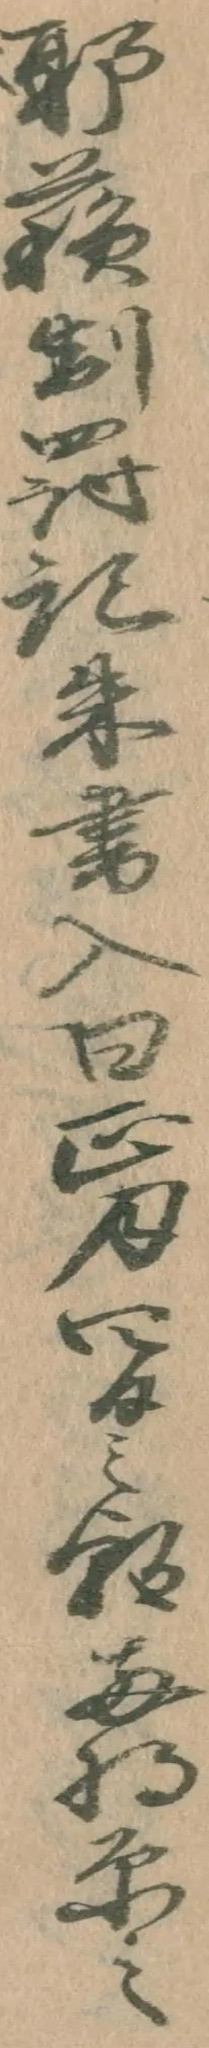耶蘇制罸記朱書入曰正月四日之朝両将原之
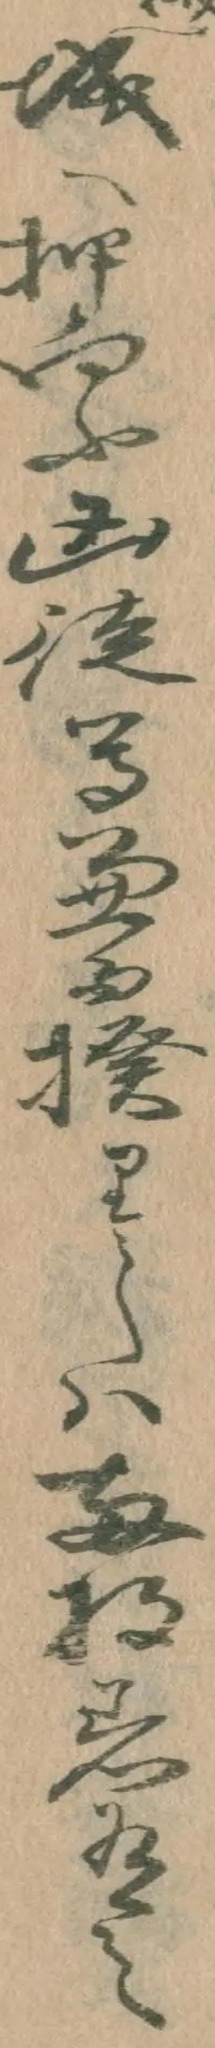賊城へ押向ふ凶徒等兼而揆里しは両将着有之
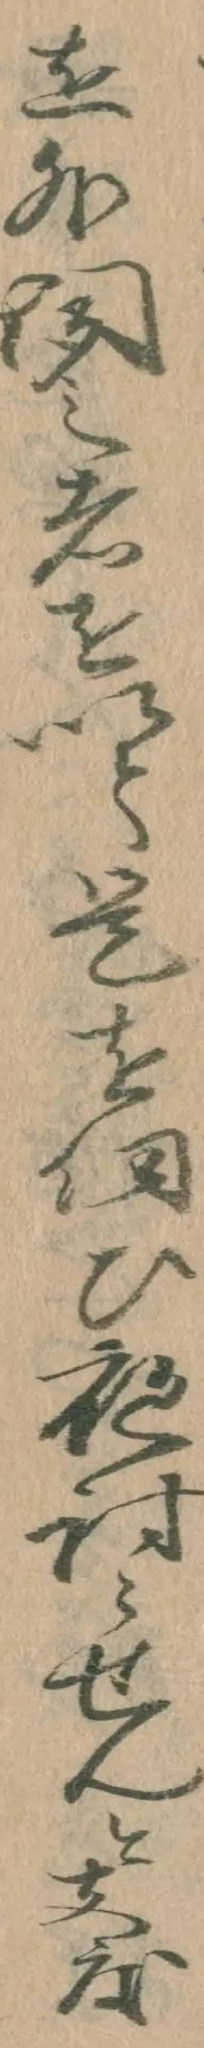を外聞之者を以て是を伺ひ夜討にせんと支度
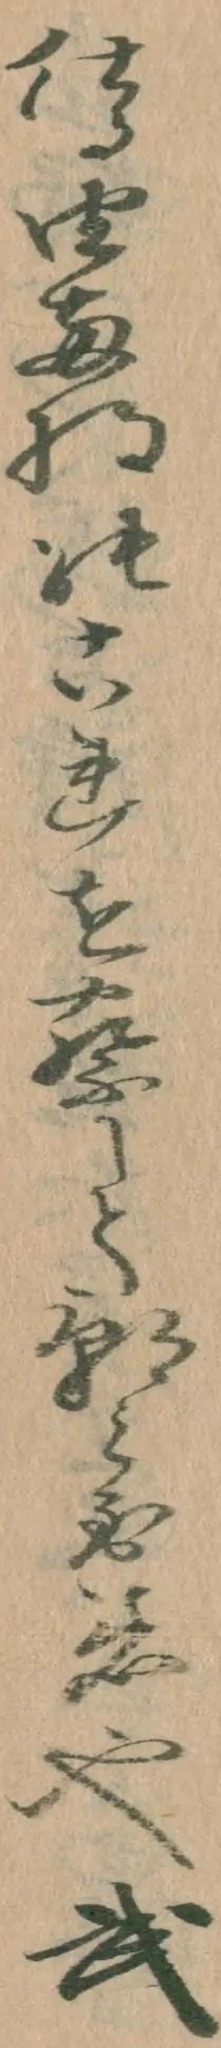仕る由両将能古連を察して朝之至着や武
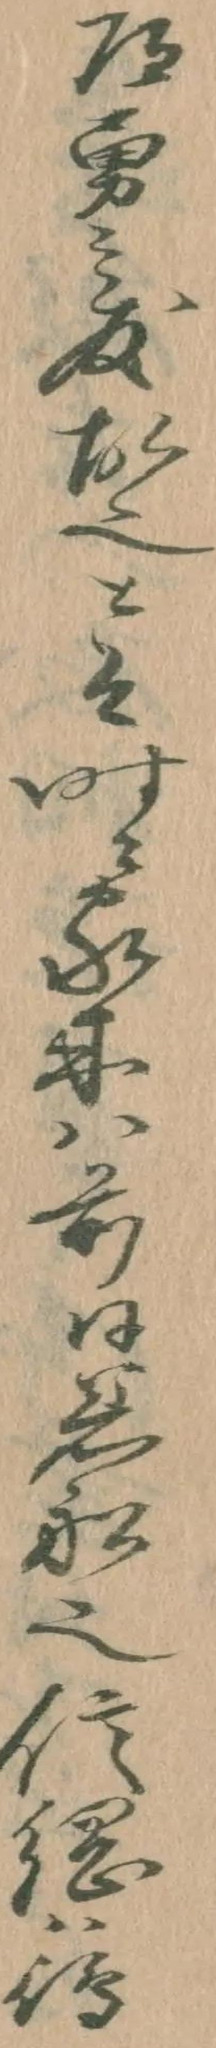道勇み敷故也とそ叶に家来は前日着舩也信綱は島
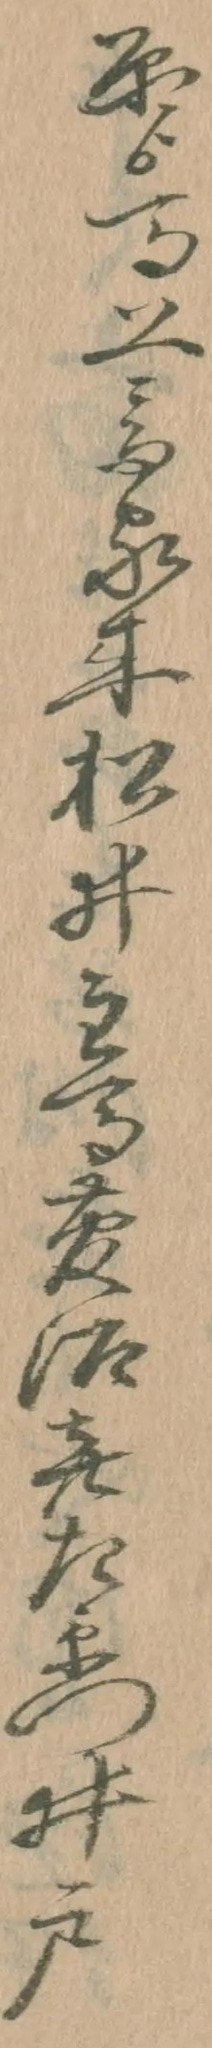原ゟ馬上に而家来松井主馬藤沼彦左衛門井戸
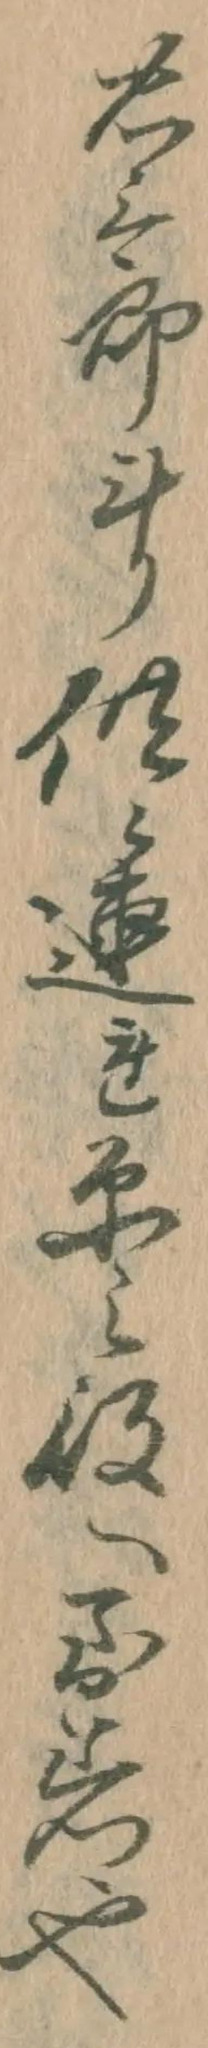忠三郎斗り供に連れ原之役へ至着也
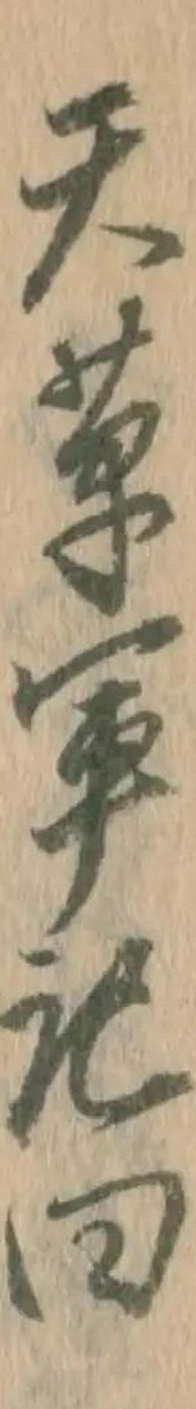天草軍記曰
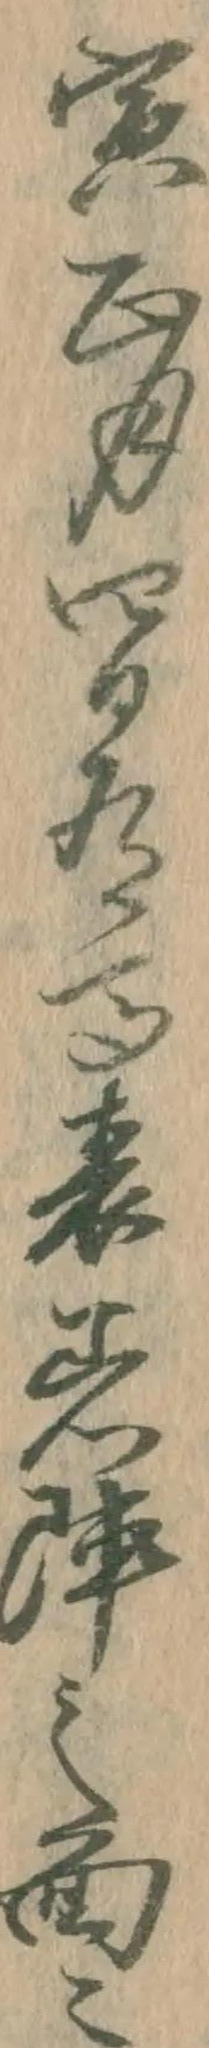寅正月四日有馬表着陣之面々
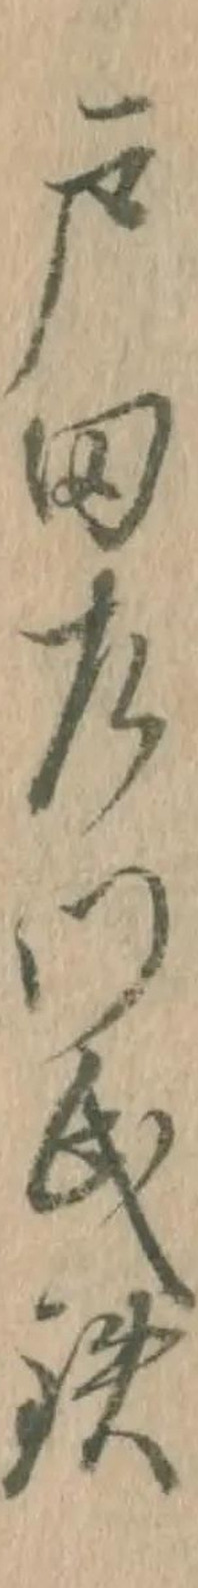戸田左門氏鉄
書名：切支丹御退治記 49巻. [5]
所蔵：国立国会図書館 National Diet Library, JAPAN
